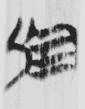於
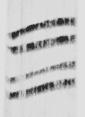亖
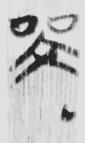{吅文}
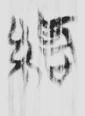紿
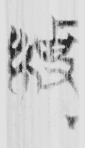{糸㝸}
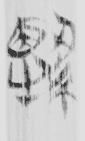{糸解}
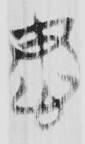{毋心}
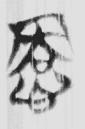{丙心}
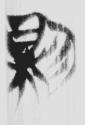則
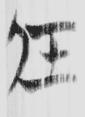任
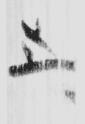之
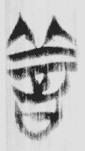善
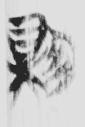則
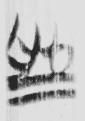爲
